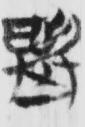○（舉）
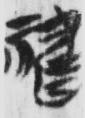禱
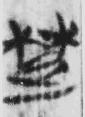楚
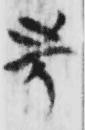先
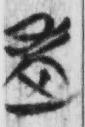老
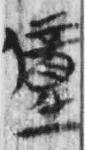僮
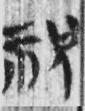祝
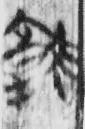○（融）
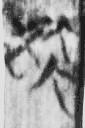毓（鬻）
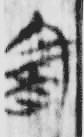酓（熊）
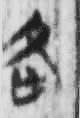各
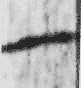一
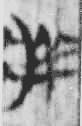牂
